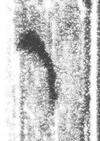人
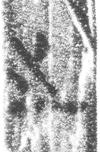之
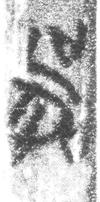器
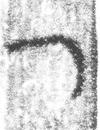一
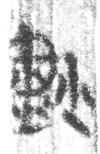鈔
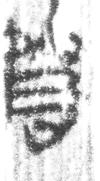○（席）
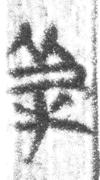○（騂）
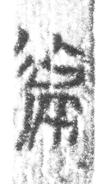綿（縵）
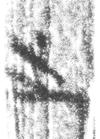之
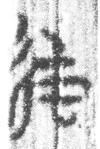純
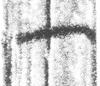一
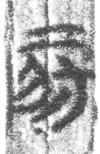房
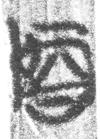机（几）
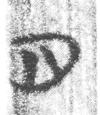四
